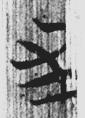求
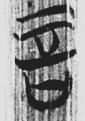言
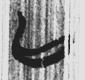㠯
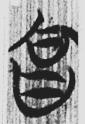合
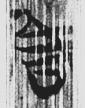唯（雖）
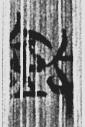鈙（伏）
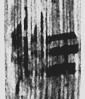於
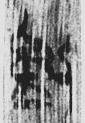○（斧）
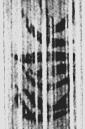疐（鑕）
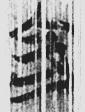命
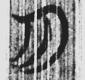勿
